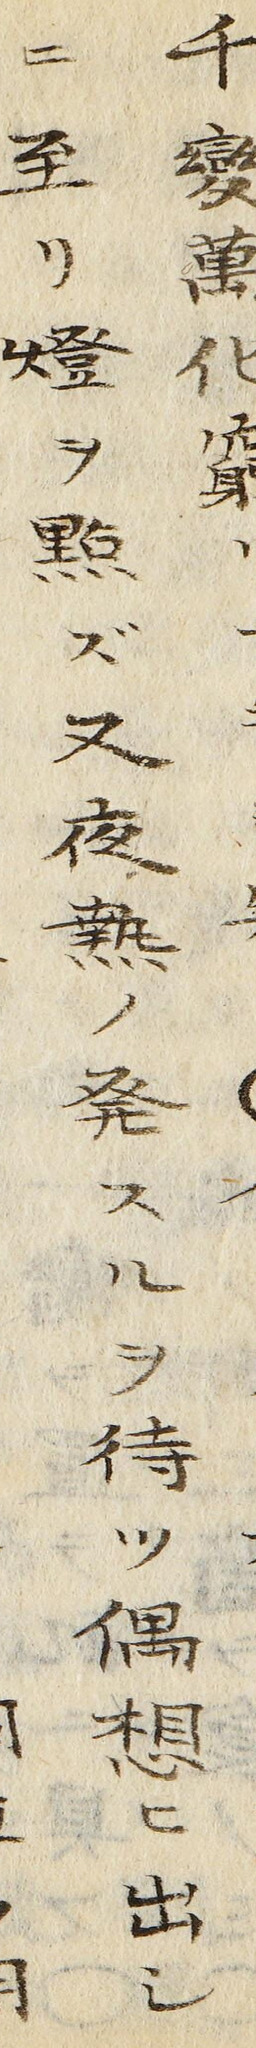ニ至リ灯ヲ点ズ又夜熱ノ発スルヲ待ツ偶想ヒ出シ
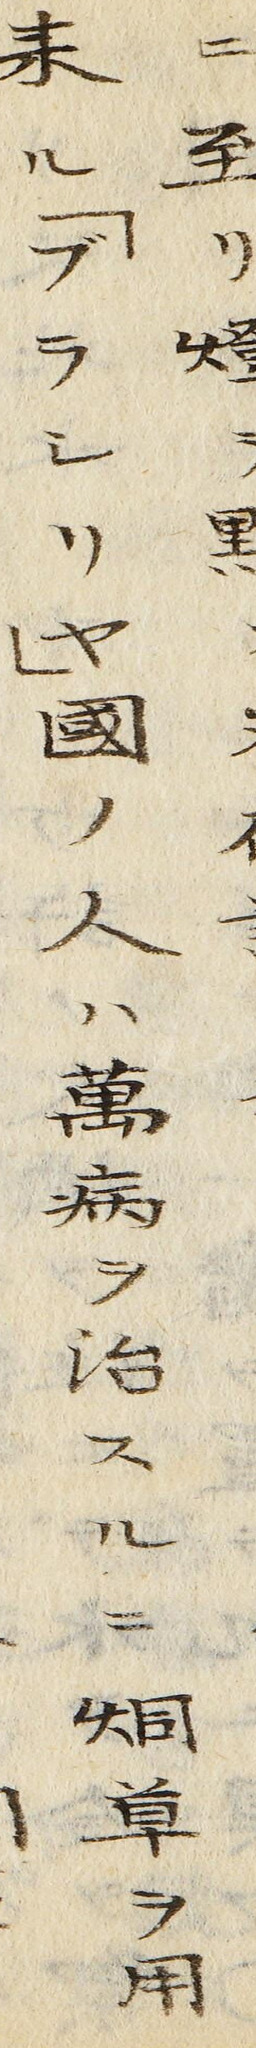来ル「ブラシリア」国ノ人ハ万病ヲ治スルニ煙草ヲ用
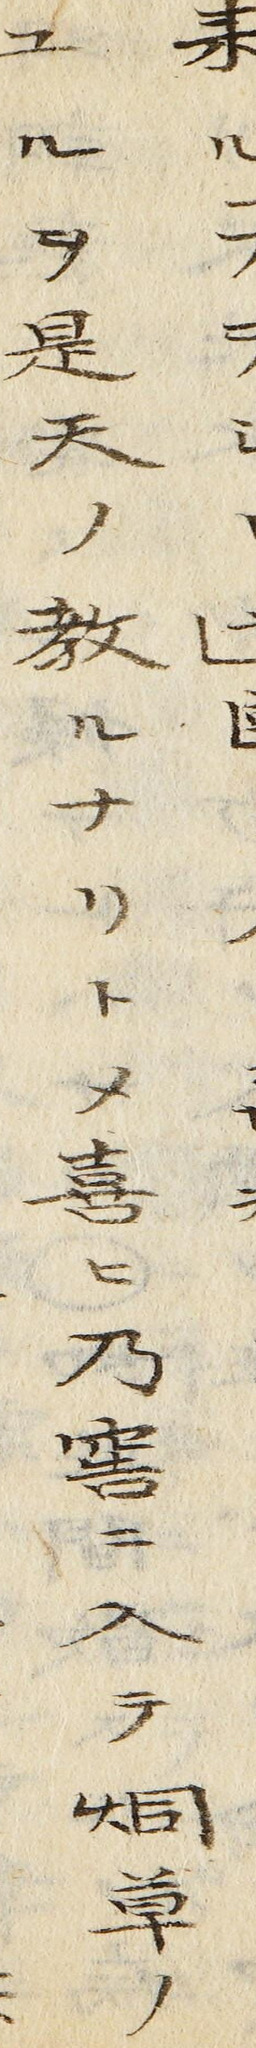ユルヲ是天ノ教ルナリトシテ喜ヒ乃窖ニ入テ煙草ノ
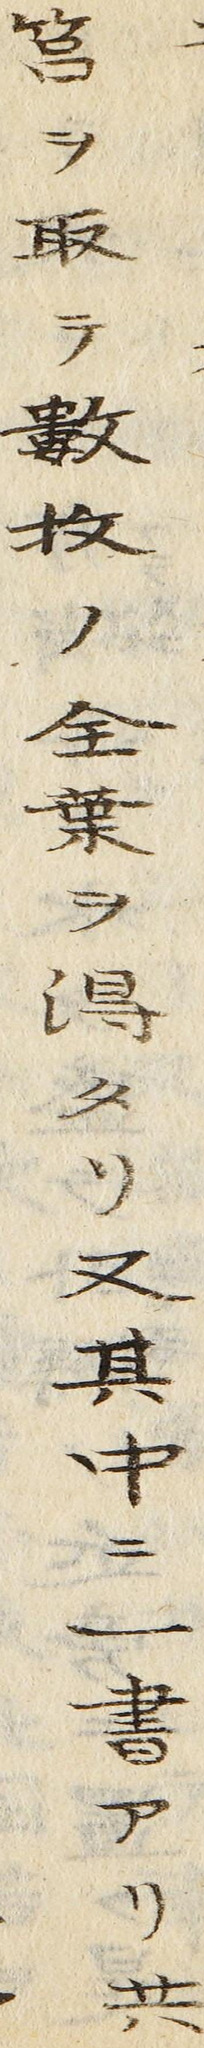筥ヲ取テ数枚ノ全葉ヲ得タリ又其中ニ一書アリ共
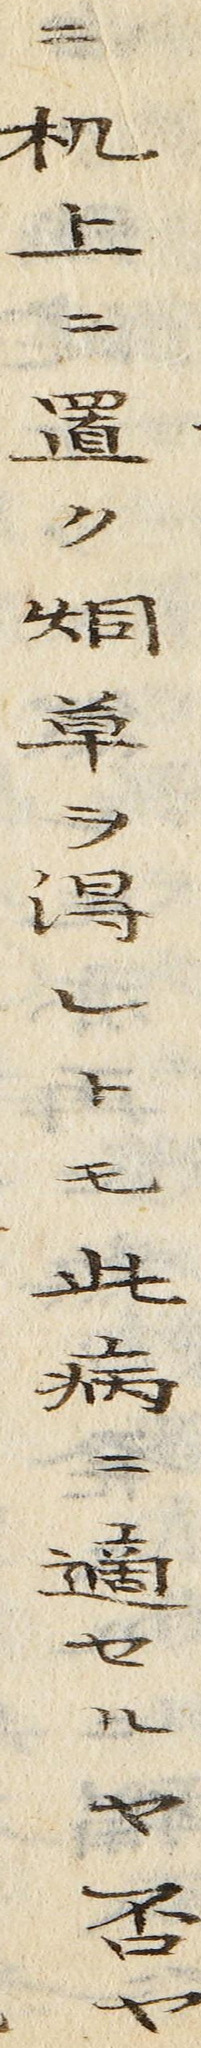ニ机上ニ置ク煙草ヲ得レトモ此病ニ適セルヤ否ヤ
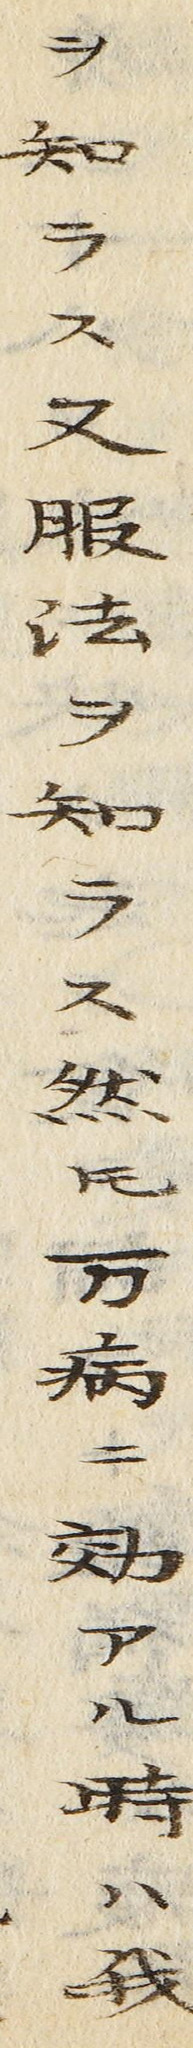ヲ知ラス又服法ヲ知ラス然トモ万病ニ効アル時ハ我
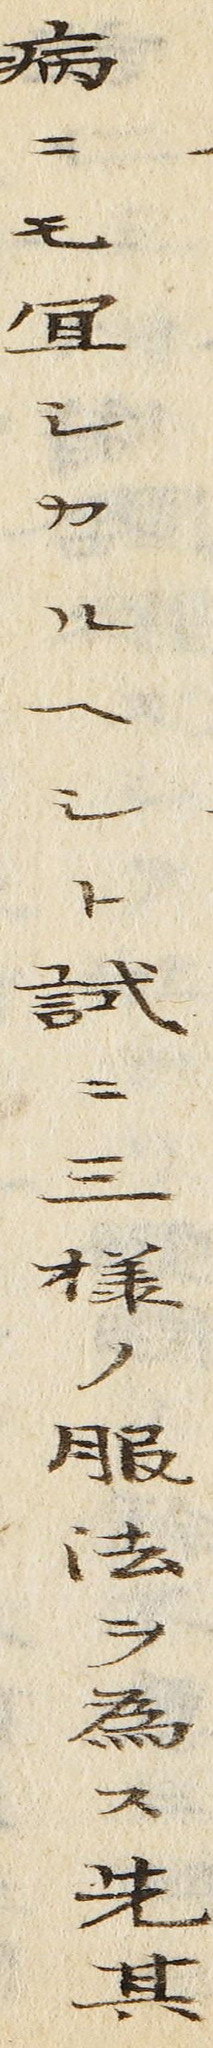病ニモ宜シカルヘシト試ニ三様ノ服法ヲ為ス先其
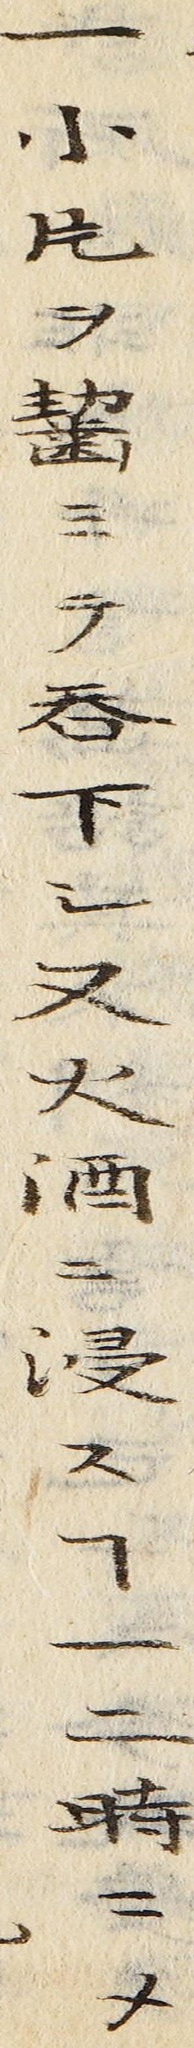一小片ヲ齧ミテ呑下シ又火酒ニ浸スコト一二時ニシテ
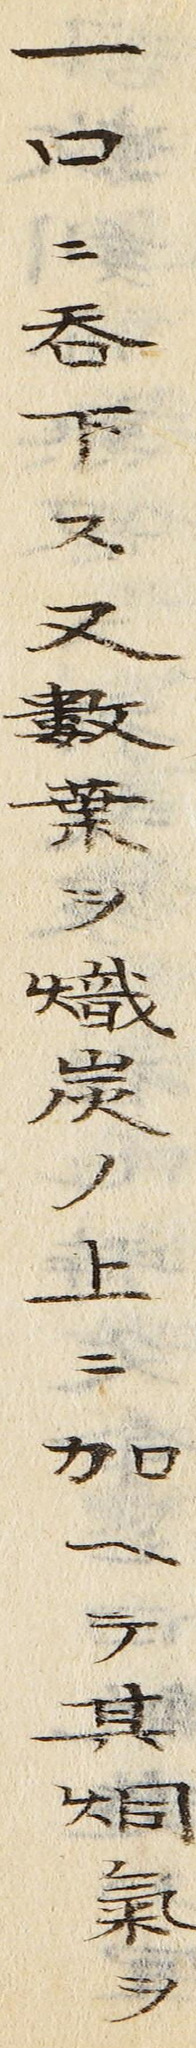一口ニ呑下ス又数葉ヲ熾炭ノ上ニ加ヘテ其煙気ヲ
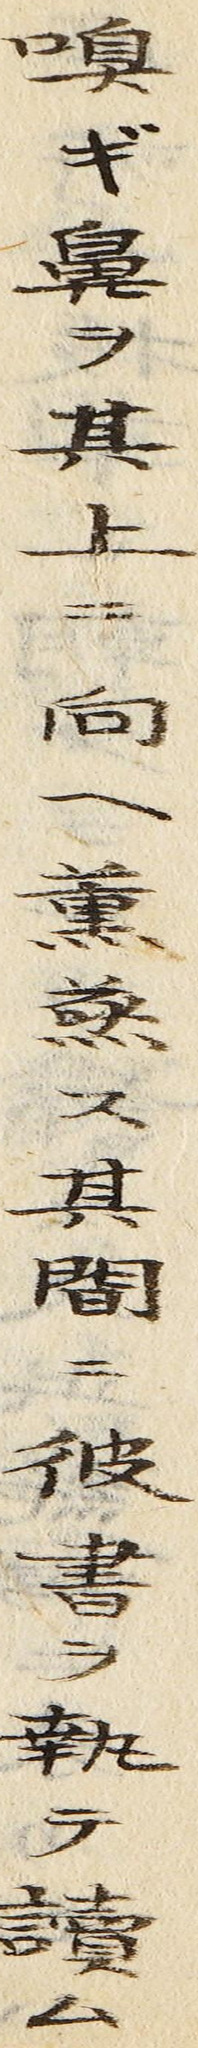嗅ギ鼻ヲ其上ニ向ヘ薫蒸ス其間ニ彼書ヲ執テ読ム
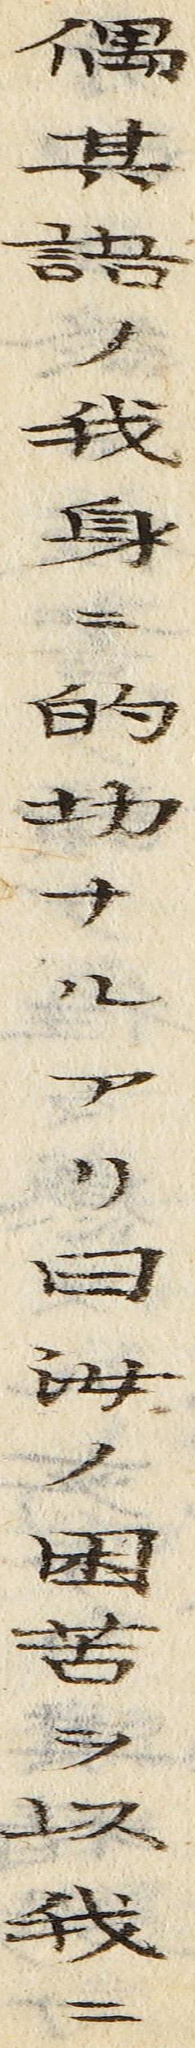偶其語ノ我身ニ的功ナルアリ曰汝ノ困苦ヲ以我ニ
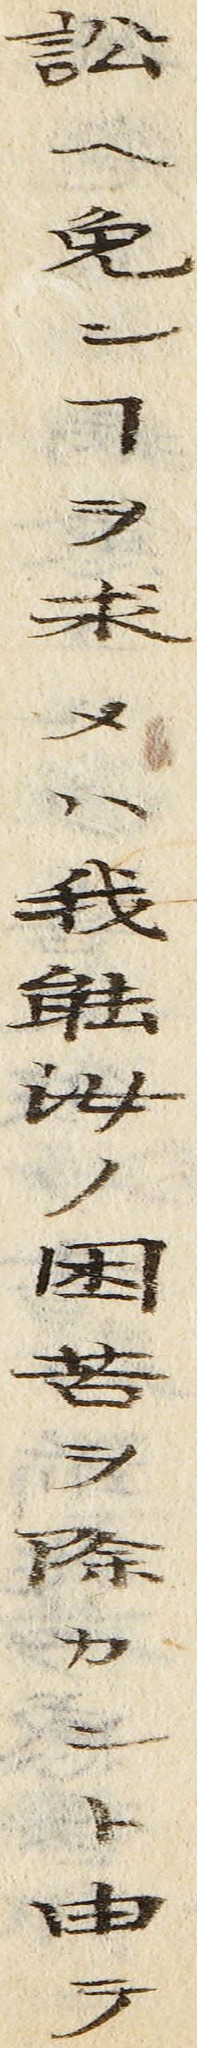訟ヘ免ンコトヲ求メハ我能汝ノ困苦ヲ除カント由テ
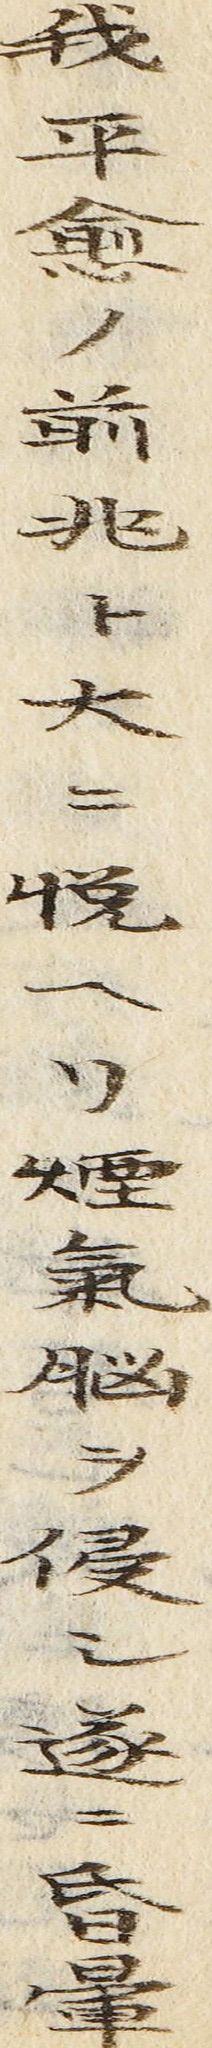我平愈ノ前兆ト大ニ悦ヘリ煙気脳ヲ侵シ遂ニ昏暈
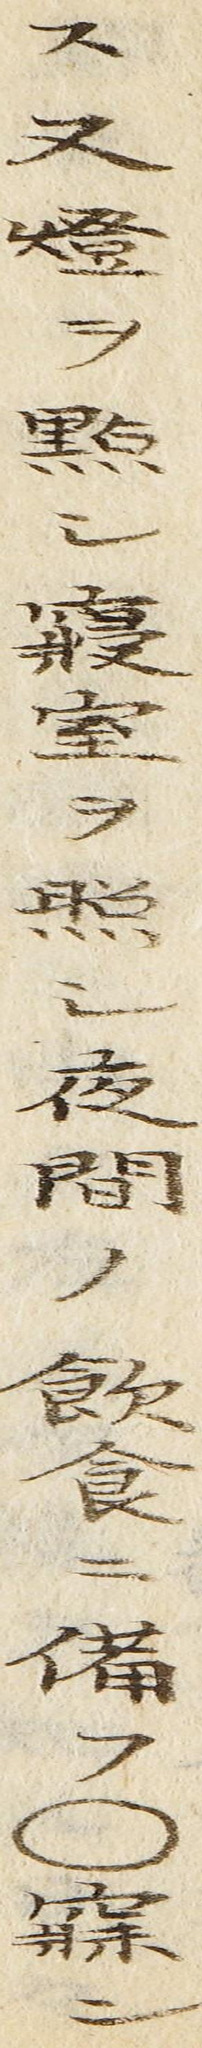ス又灯ヲ点シ寝室ヲ照シ夜間ノ飲食に備フ◯寐ン
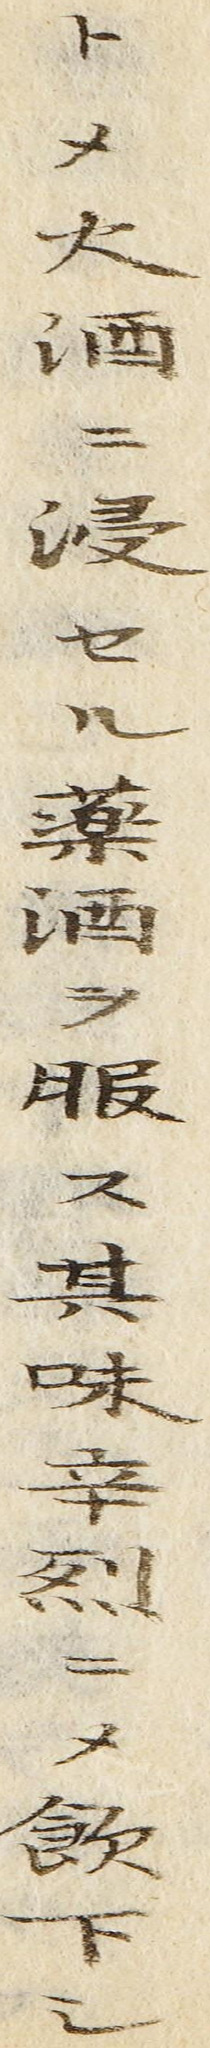トシテ火酒ニ浸セル薬酒ヲ服ス其味辛烈ニシテ飲下シ
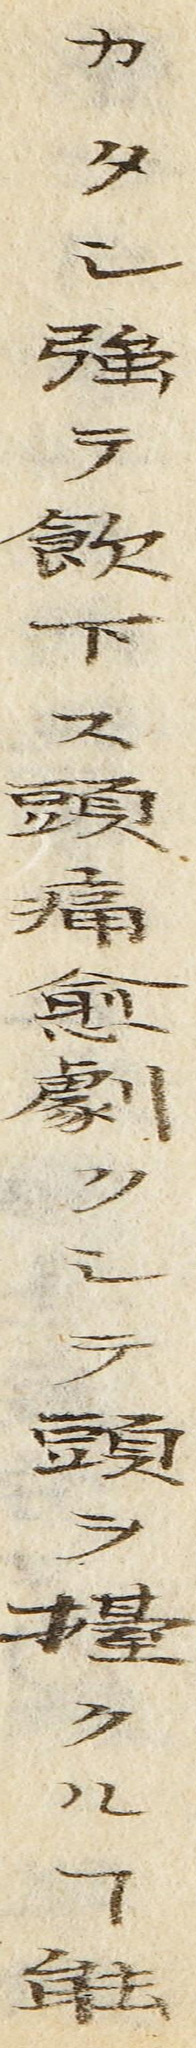カタシ強テ飲下ス頭痛愈劇クシテ頭ヲ擡クルコト能
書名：漂流紀事
